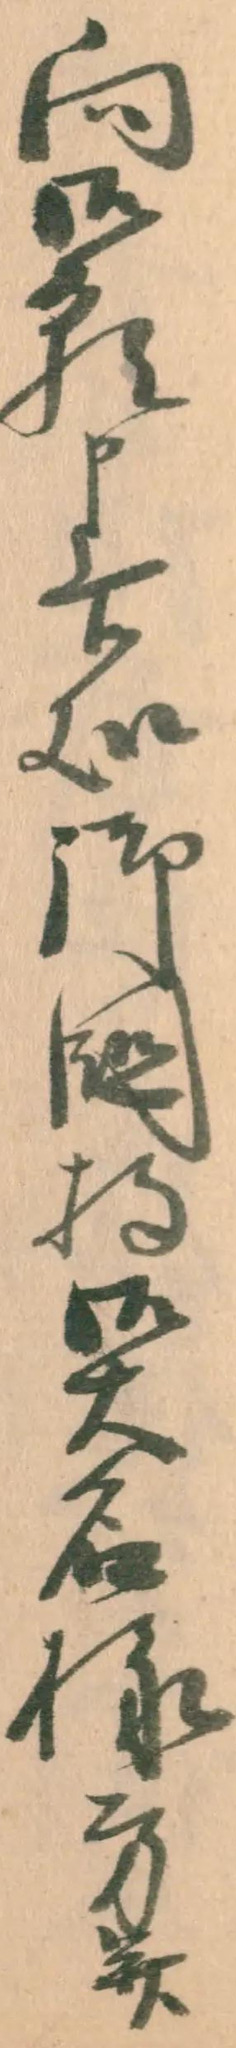向御願申上候処御国持御大名様方并
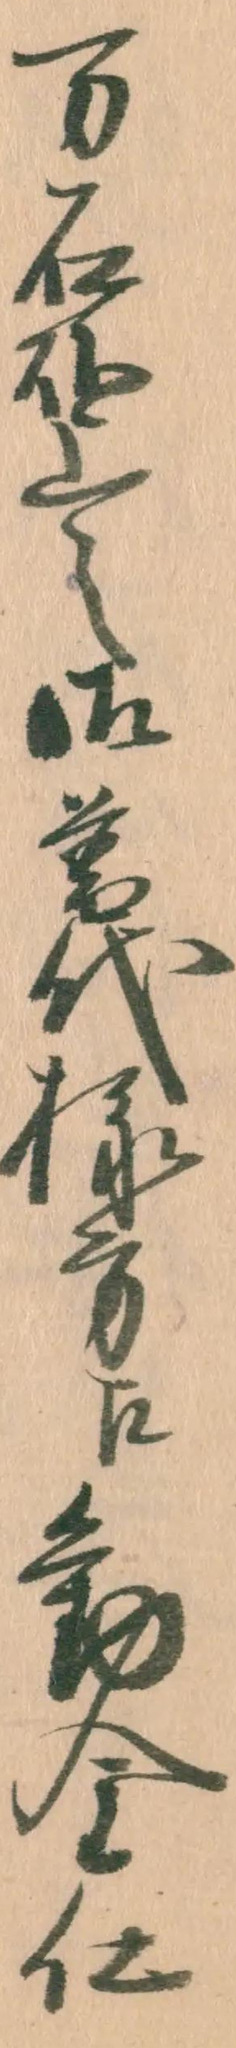万石以上之御譜代様方え勧金仕
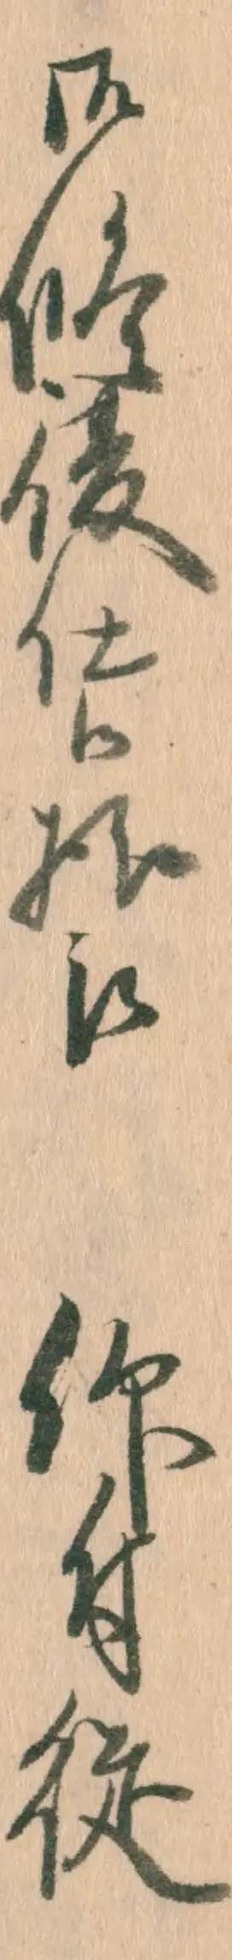御修復仕候様被仰付従
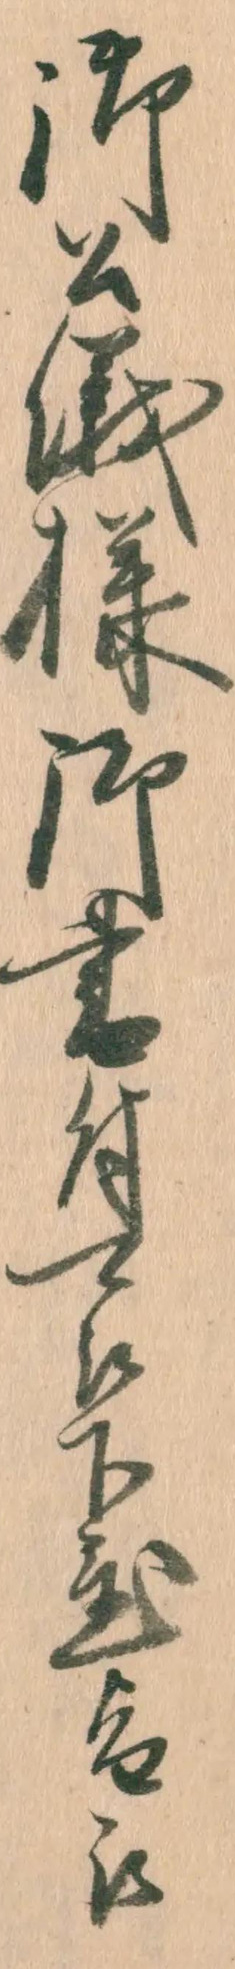御公儀様御書付可被下置旨被
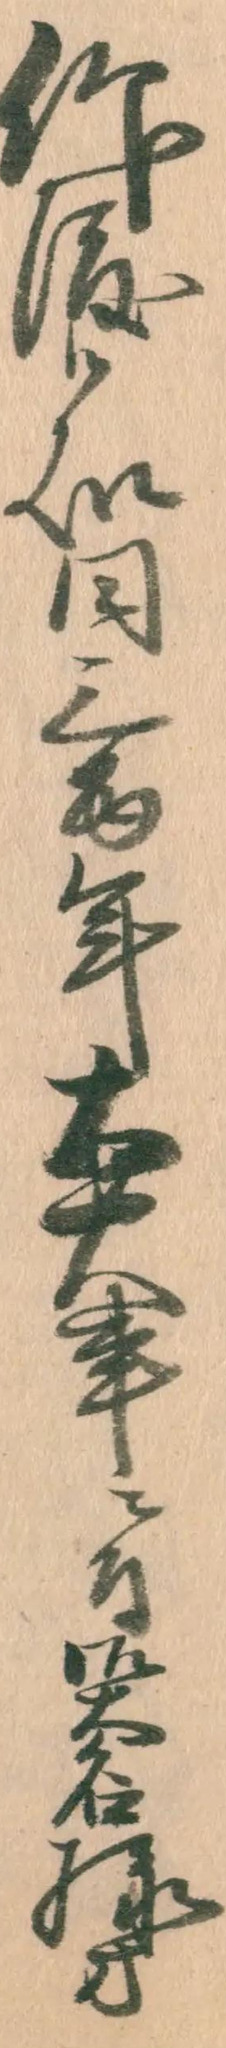仰渡候処同三酉年大火事に付御大名様方
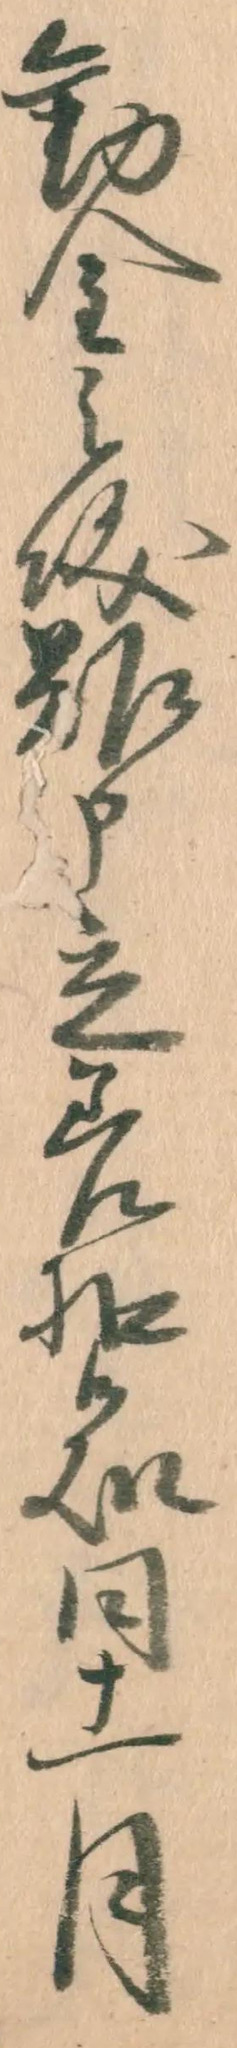勧金之儀難申立差扣候処同十一月

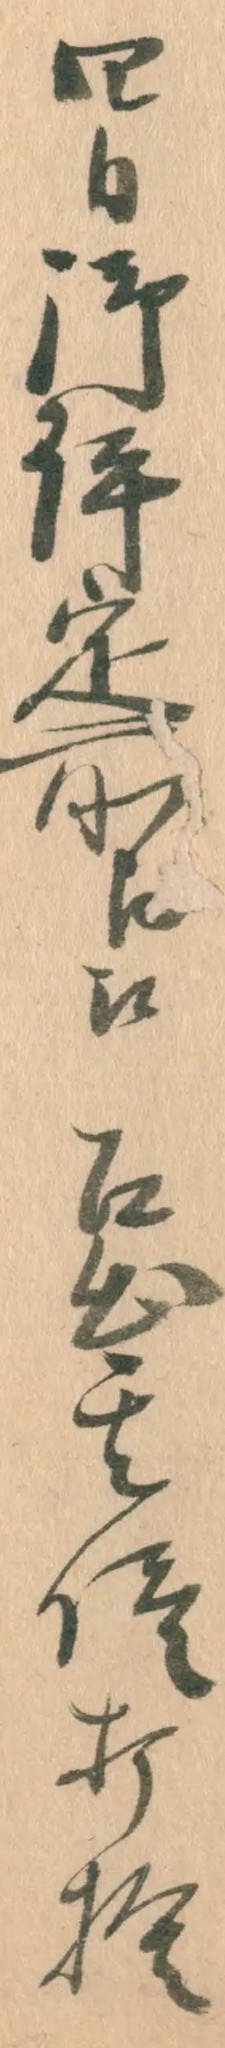四日御評定所え被召出其侭打捨
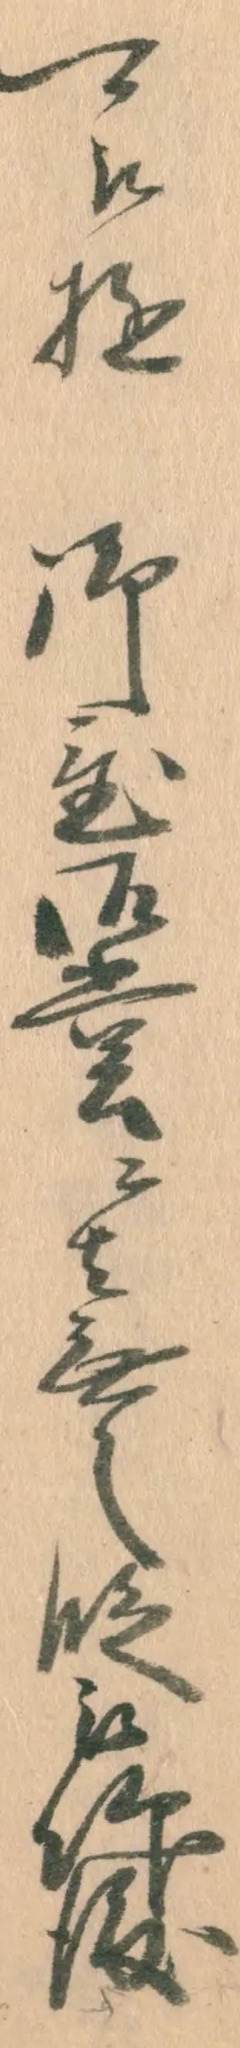可被遊御置御堂には無之段被仰渡
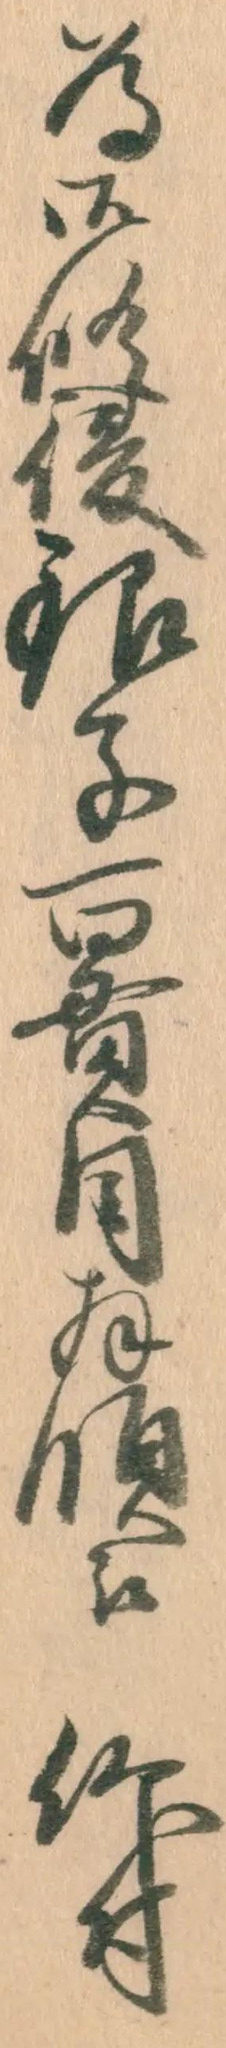為御修復銀子百貫目拝領被仰付
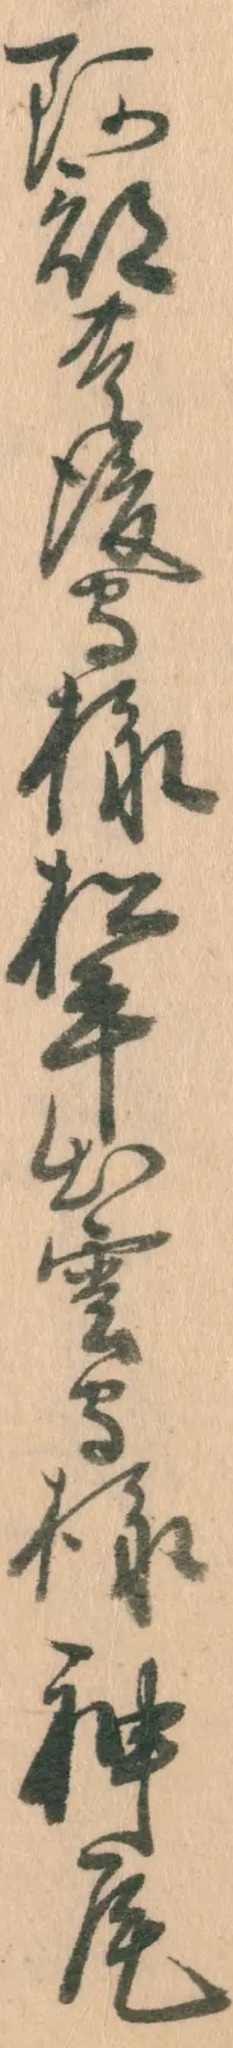阿部豊後守様松平出雲守様神尾
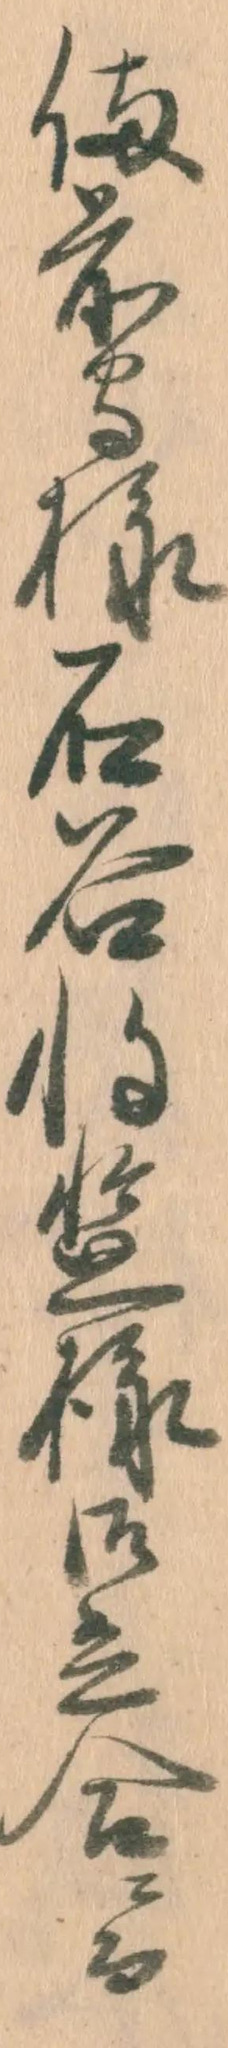備前守様石谷将監様御立合に而
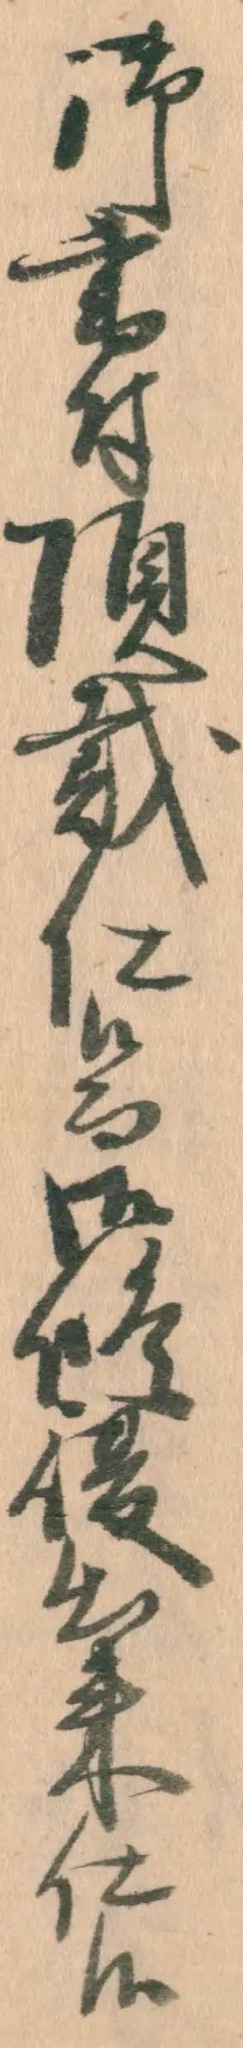御書付頂戴仕候而御修復出来仕候
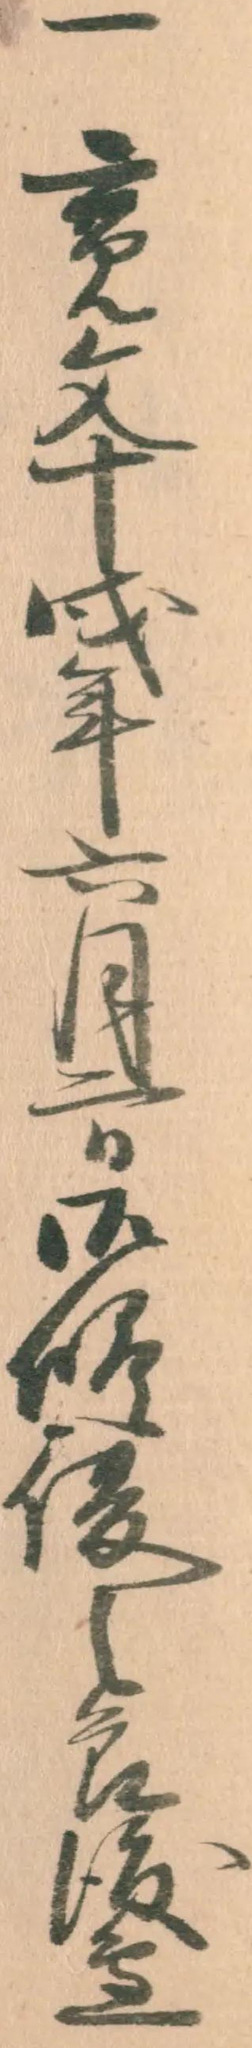一寛文十戌年六月二日御修復之節渡辺
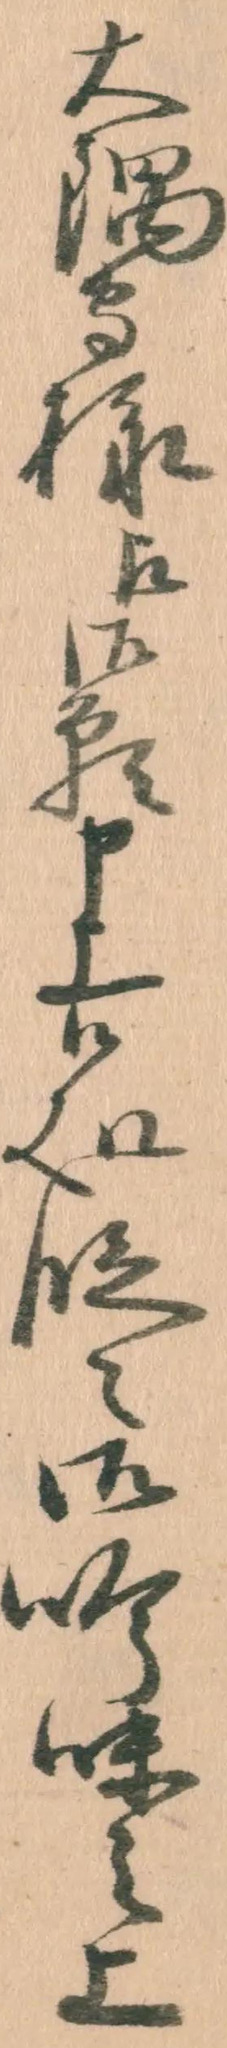大隅守様え御願申上候処段々御吟味之上
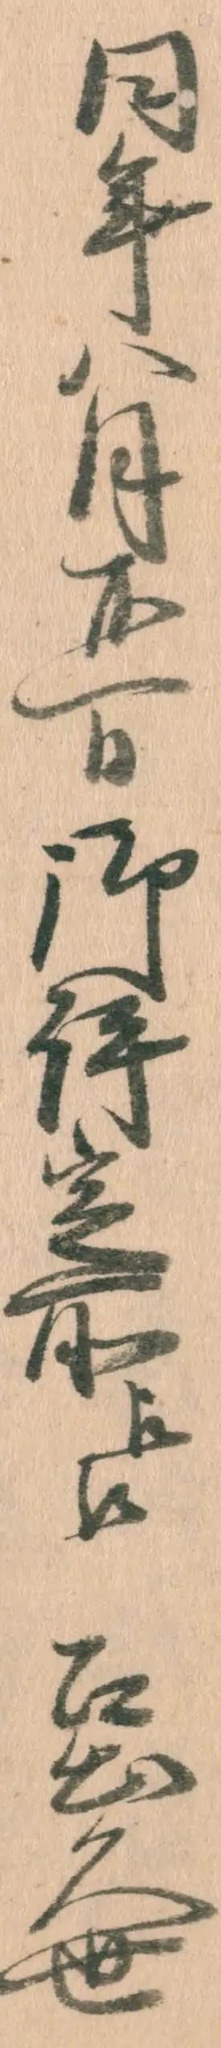同年八月廿一日御評定所え被召出久世
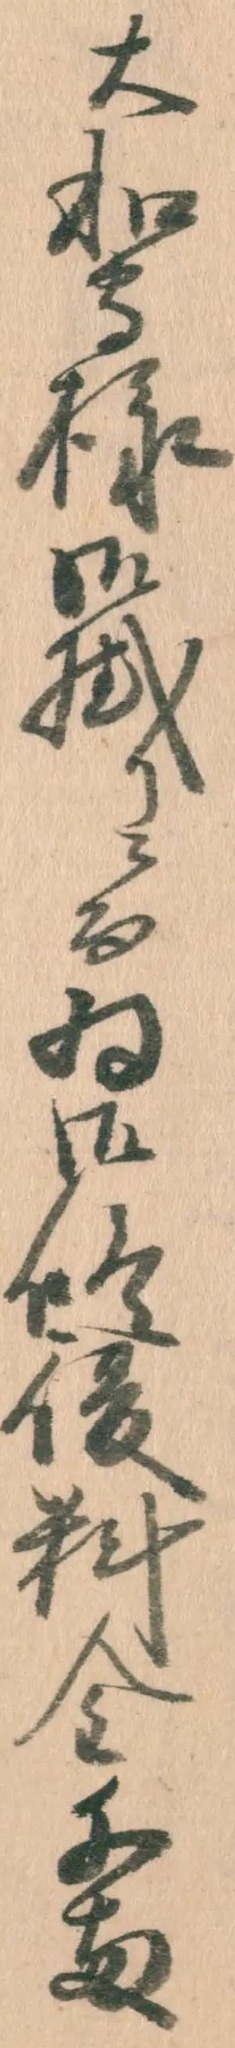大和守様御掛りに而為御修復料金千両
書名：三十三間堂. [1]
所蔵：国立国会図書館 National Diet Library, JAPAN
